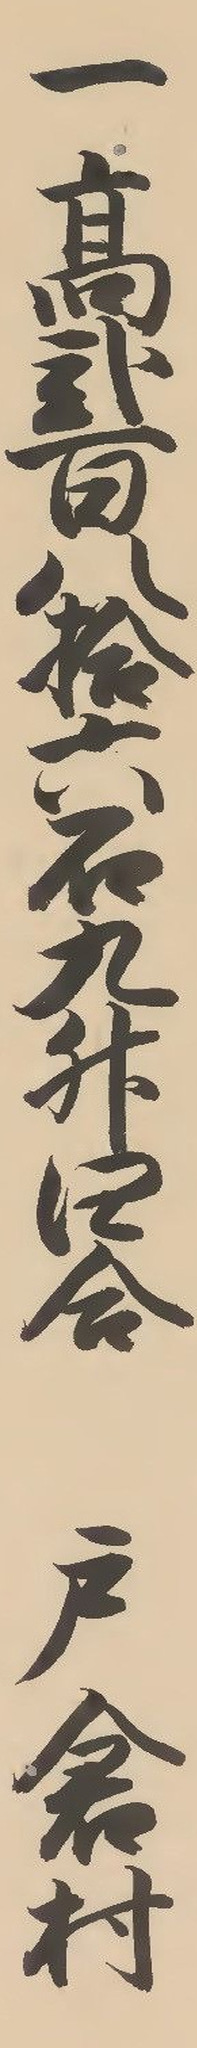一髙弐百八拾六石九升四合戸倉村
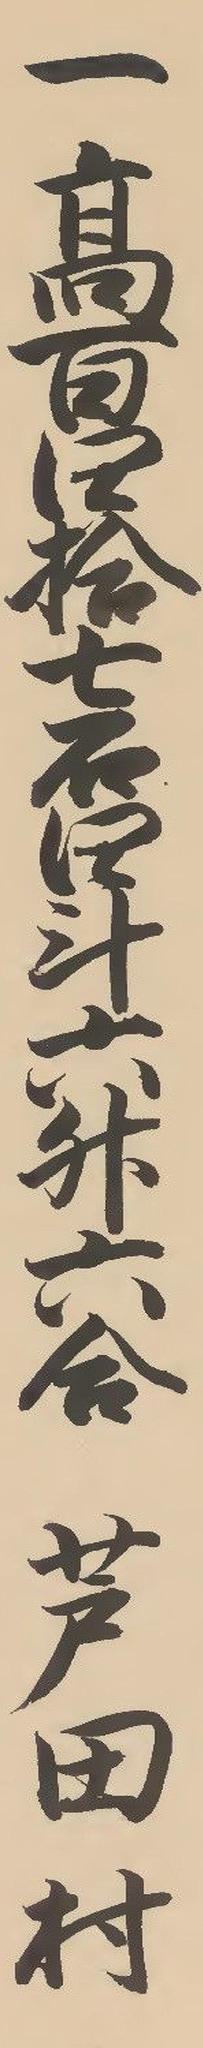一髙百四拾七石四斗六升六合芦田村
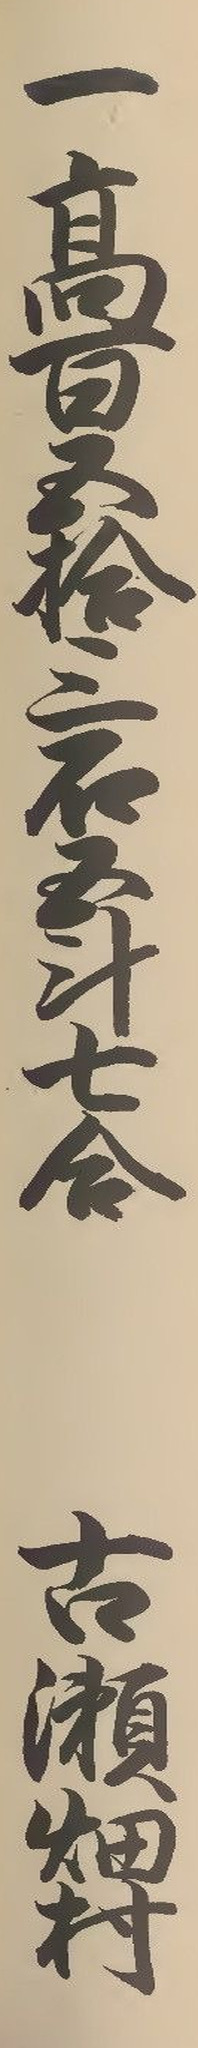一髙百五拾三石五斗七合古瀬畑村
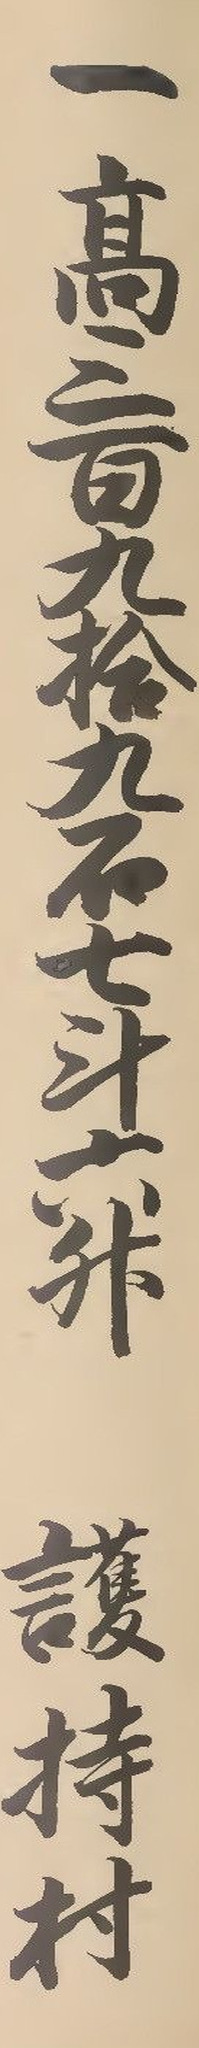一髙三百九拾九石七斗六升護持村
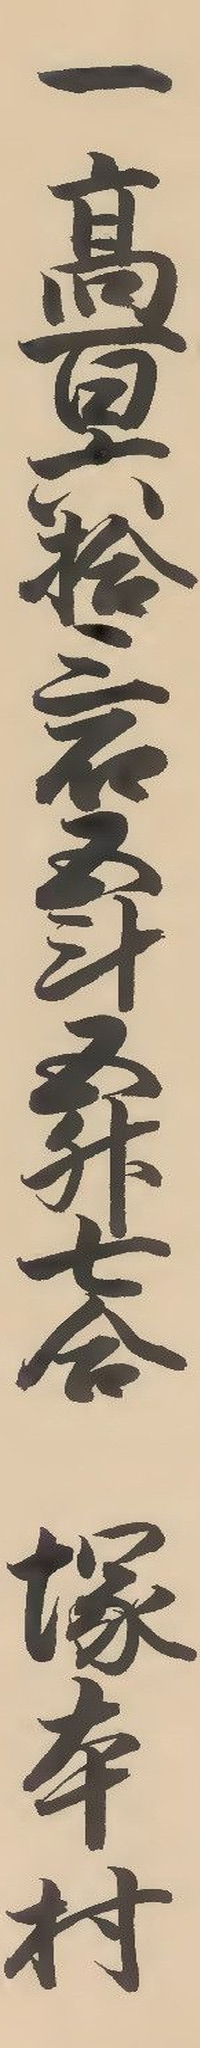一髙百六拾三石五斗五升七合塚本村
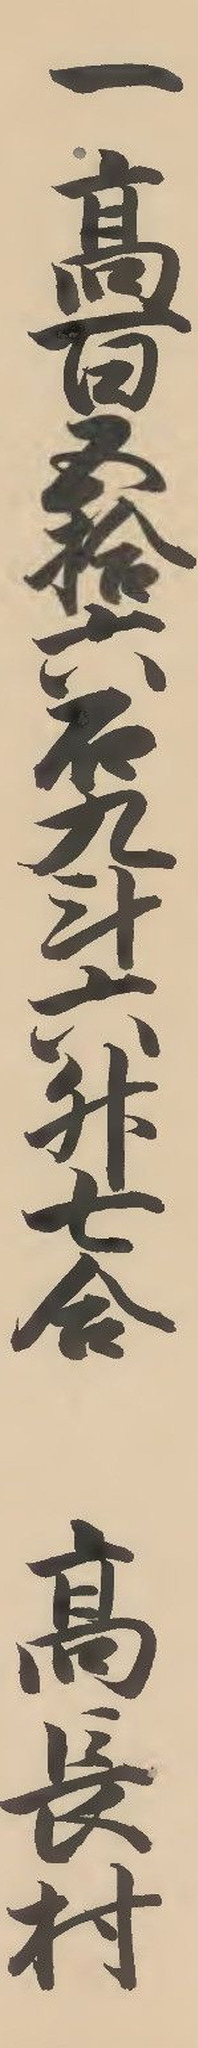一髙百五拾六石九斗六升七合髙長村
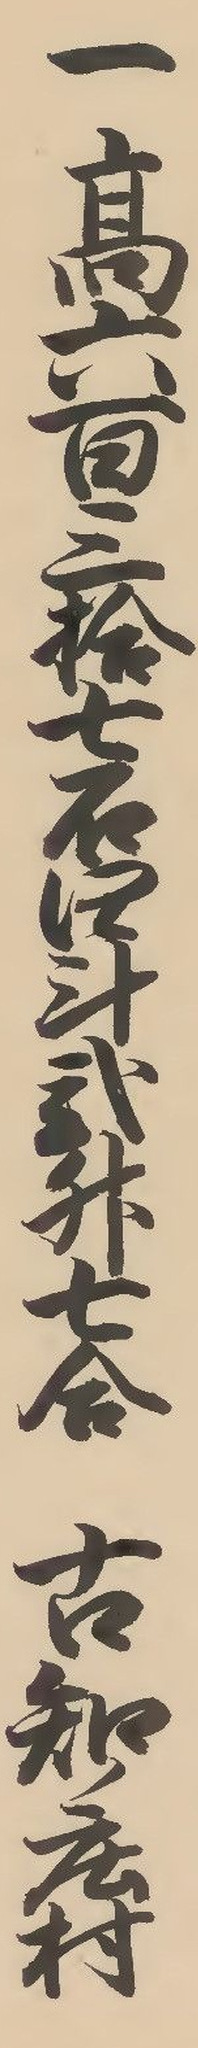一髙六百三拾七石四斗弐升七合古知ノ庄村

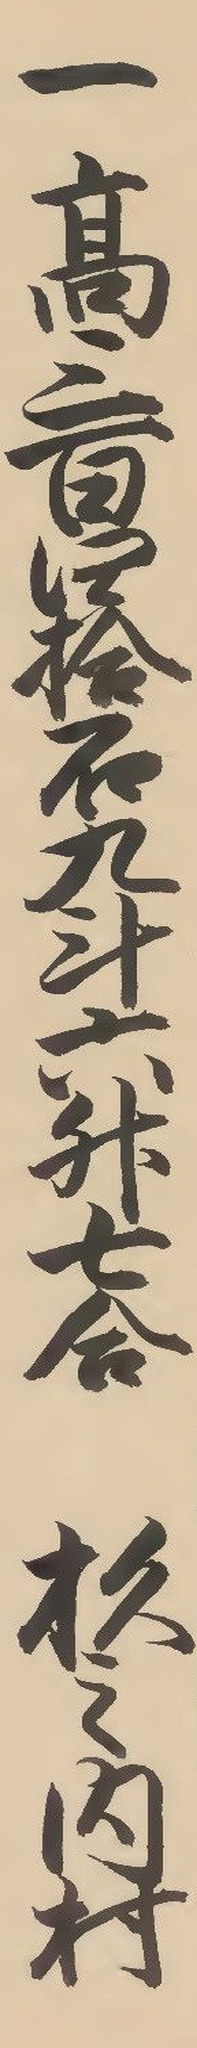一髙三百四拾石九斗六升七合杦之内村
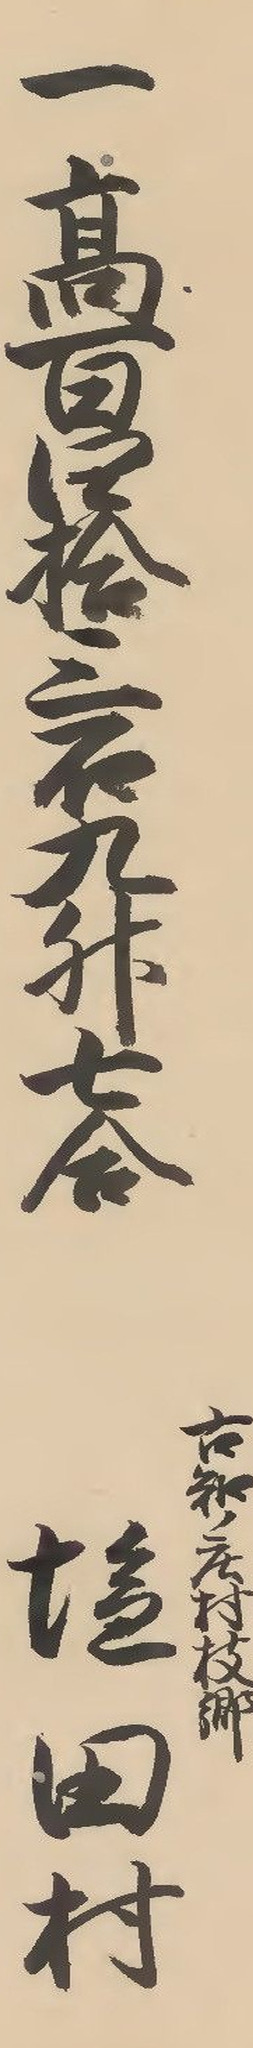一髙百四拾三石九升七合塩田村
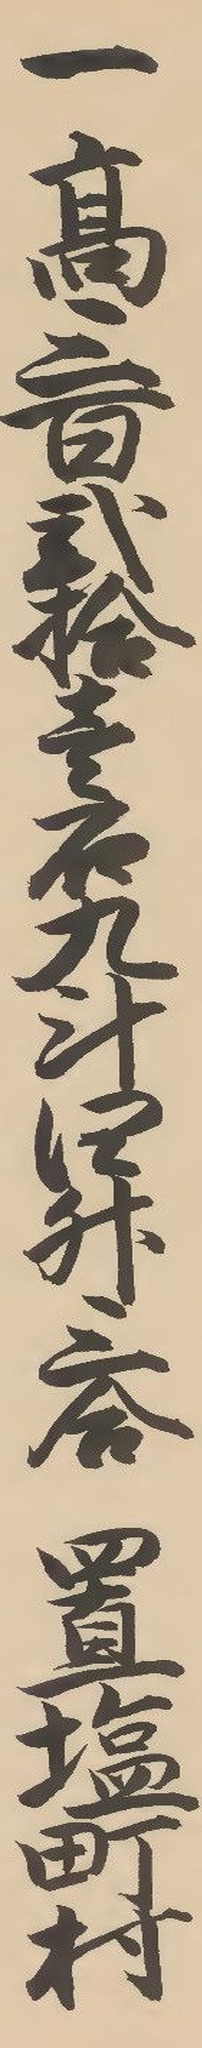一髙三百弐拾壱石九斗四升三合置塩町村
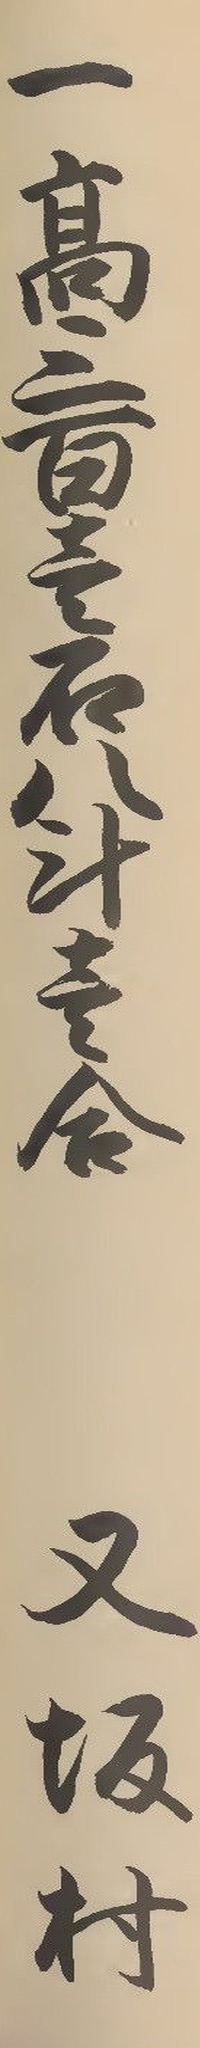一髙三百壱石八斗壱合又坂村
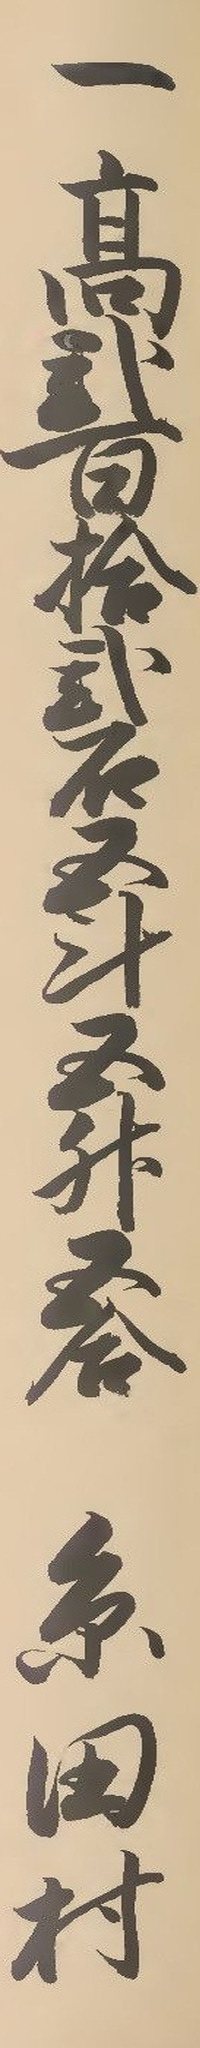一髙弐百拾弐石五斗五升五合糸田村
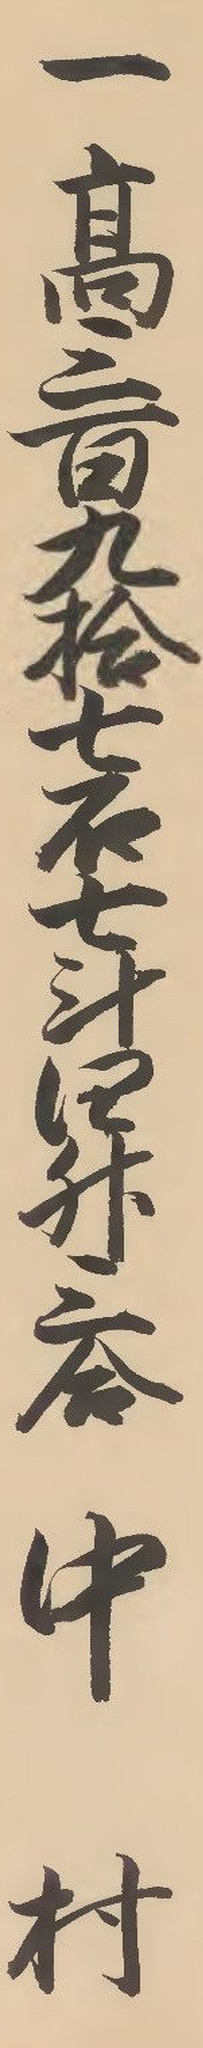一髙三百九拾七石七斗四升三合中村
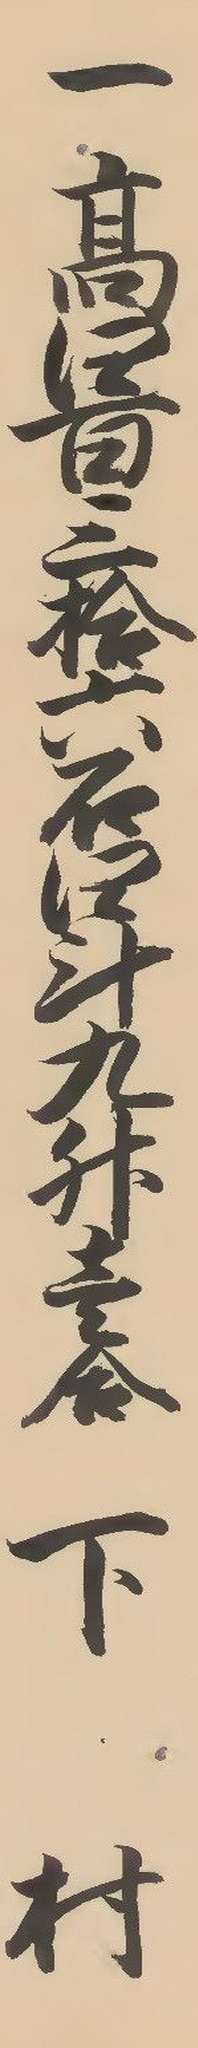一髙四百三拾六石四斗九升弐合下村
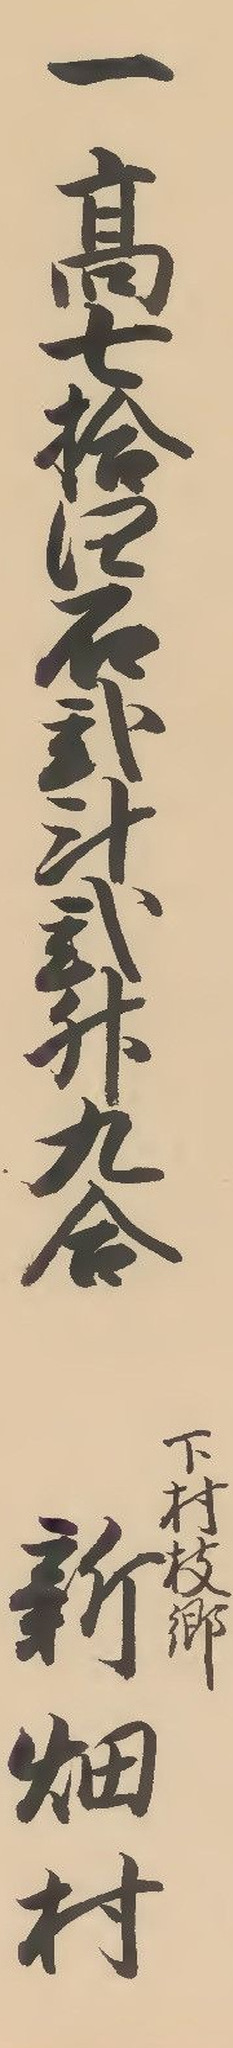一髙七拾四石弐斗弐升九合新畑村

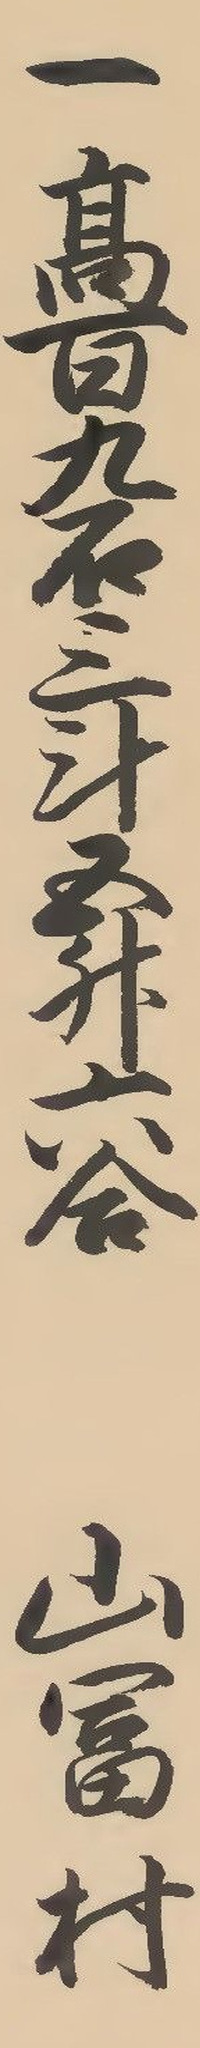一髙百九石三斗五升六合山冨村
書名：播磨国郷帳
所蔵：国立公文書館 National Archives of Japan
